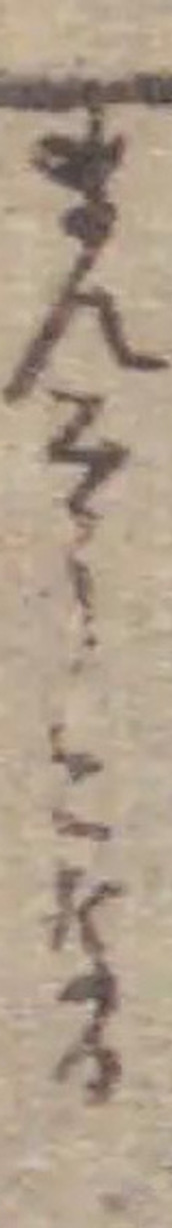まんそうとなる

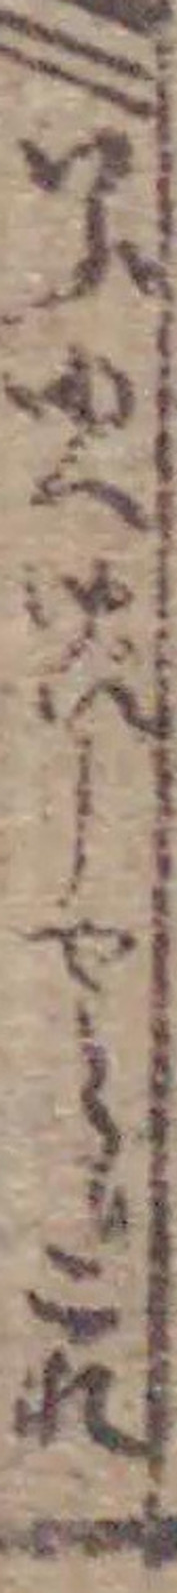いふゆへげいしやともこれ
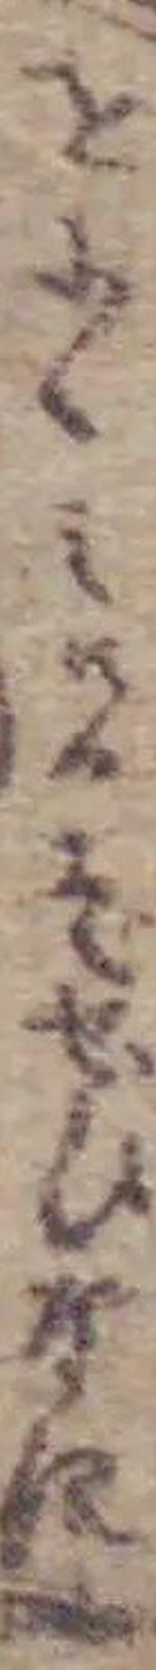をにくみけるぞぜひなき
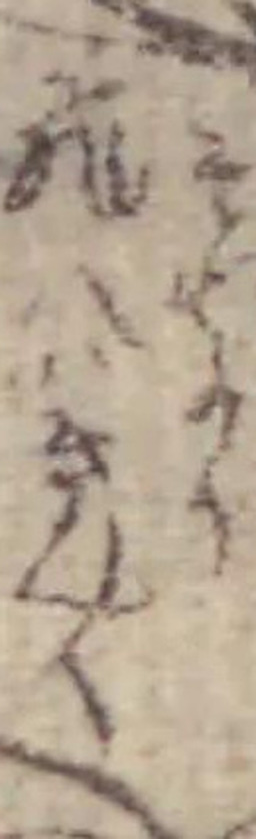飛八はきん〳〵
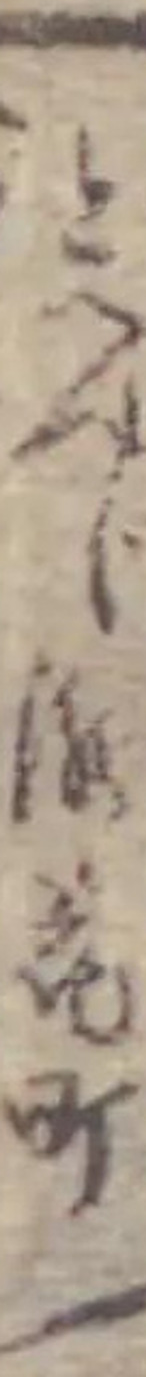とへんじ漸花町
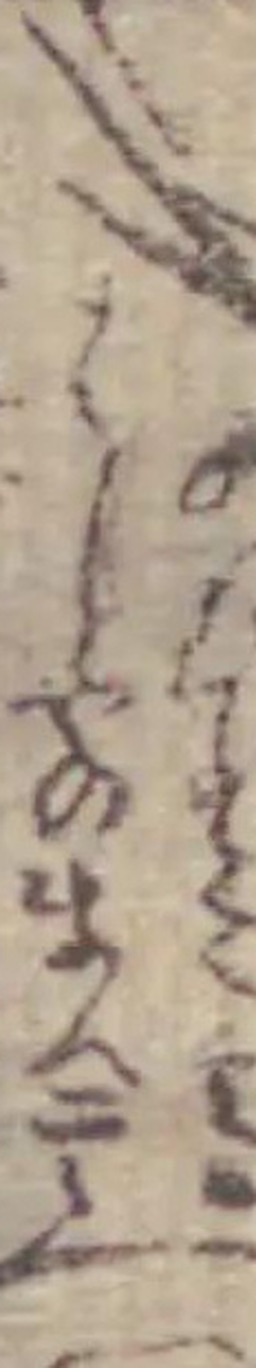はしやのまんこう
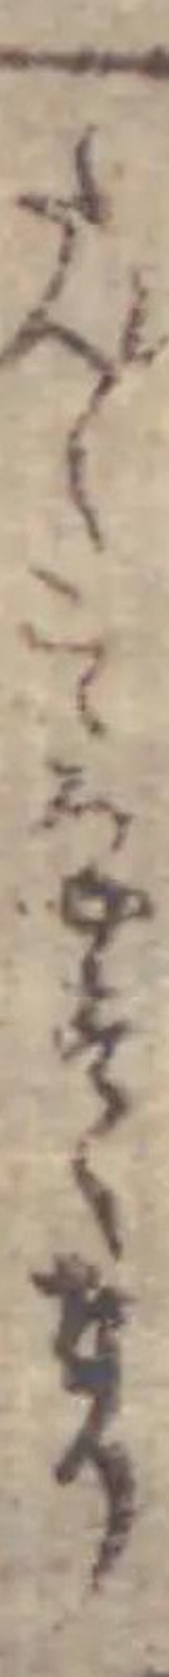たん〳〵こゝろやすくなり
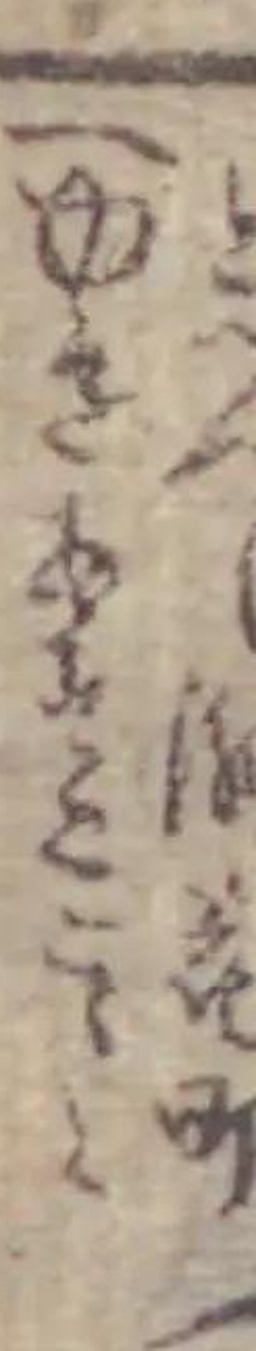へゆきあそここゝと
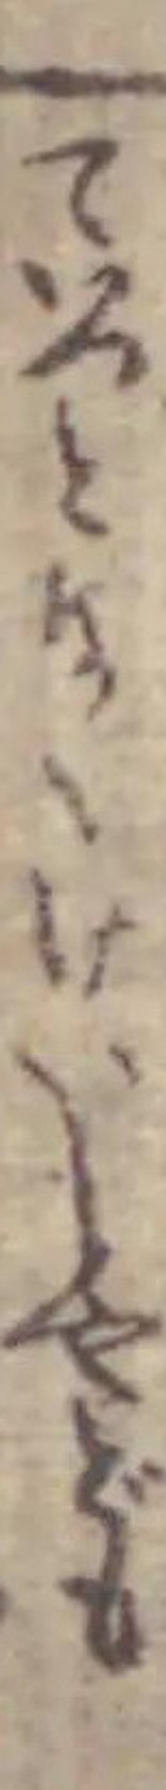ていつとなくけいしやども
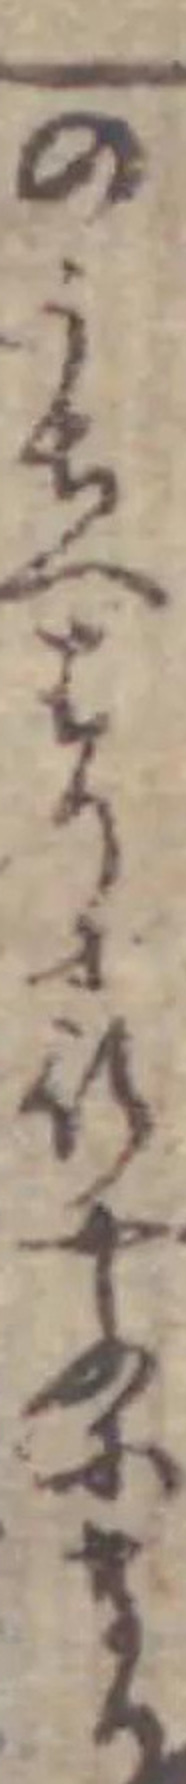のうちへはりに行やふになり
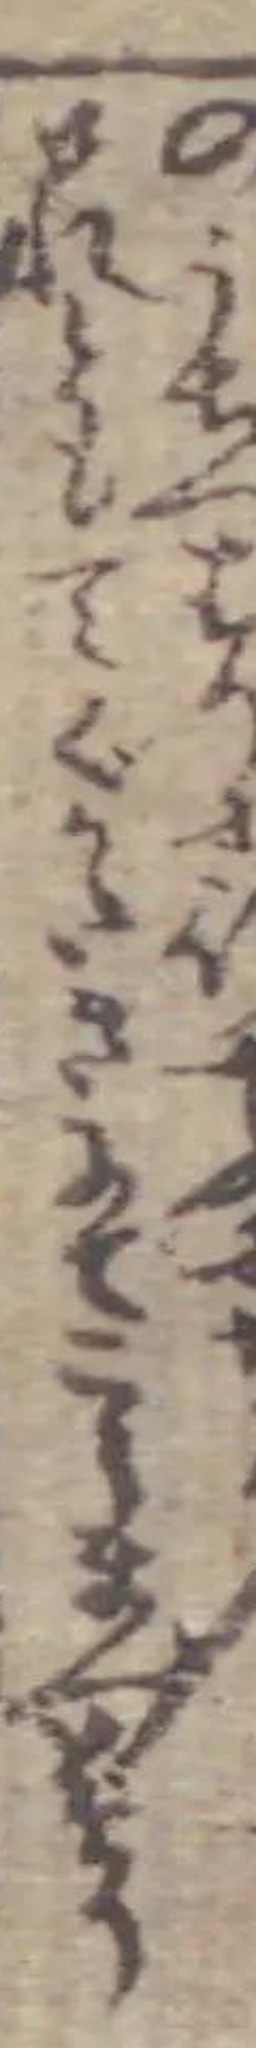けれとも天ぐかたきにてこうまんばかり
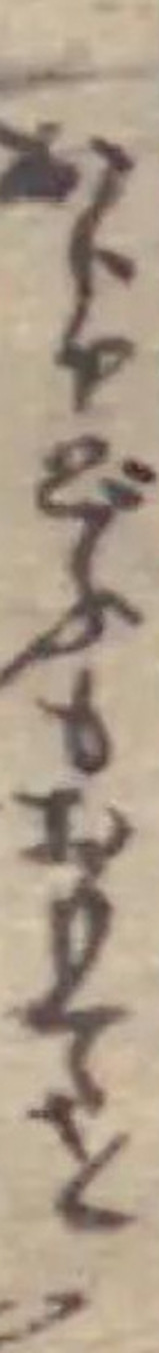おらァどふもおもてを
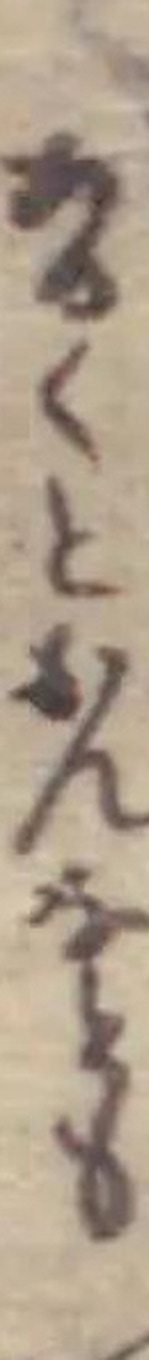あるくとおんなとも
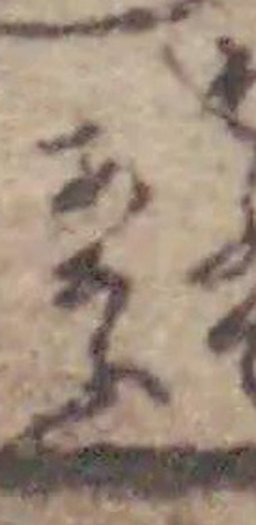あろふ

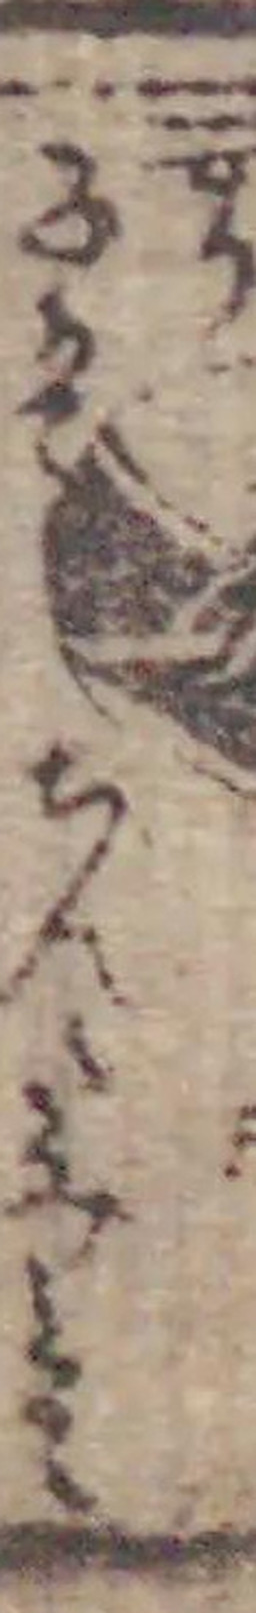子にてちんたみとて
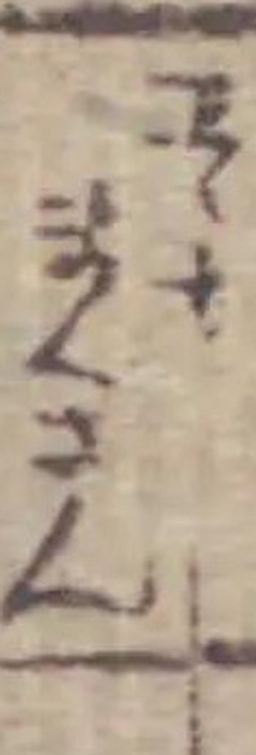まんさん
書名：通人為真似 2巻
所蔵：国立国会図書館 National Diet Library, JAPAN
